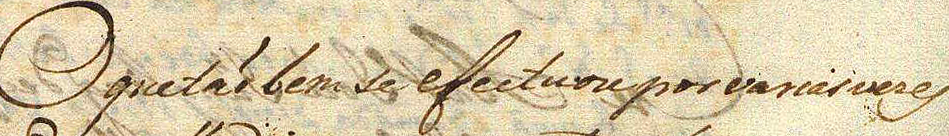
O que taõbem se efectuou por varias vezes
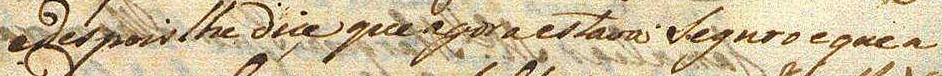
e despois lhe diçe que agora estava seguro e que a
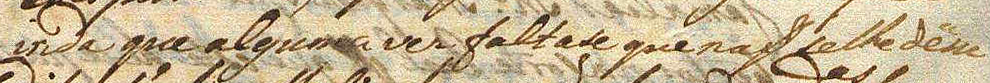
inda que alguma vez faltase que naõ selhe desse
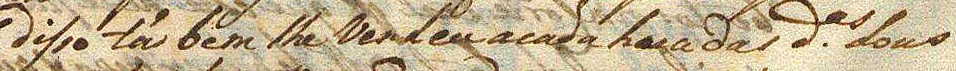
disso taõbem lhe vendeu a cada hua das d.as dous
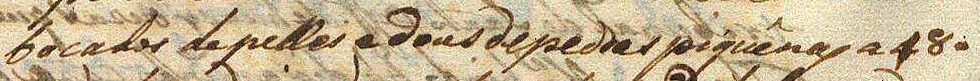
bocados de pelles e dous de pedras pequénas a 480
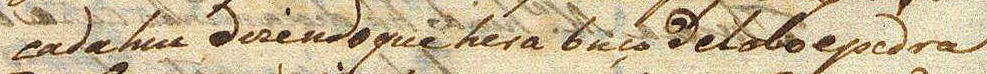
cada hua dizendo que hera buço de lobo e pedra
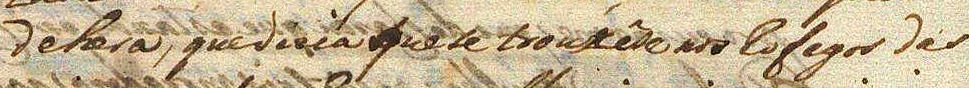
de hera, que dizia que se trouxése aos Rofegor das
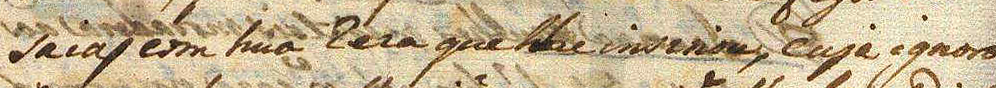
saias com hua Reza que lhe insinou, cuja ignoro
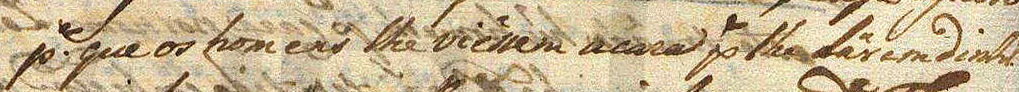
p.a que os homens lhe viessem a caza pa lhe dárem dinhr.o
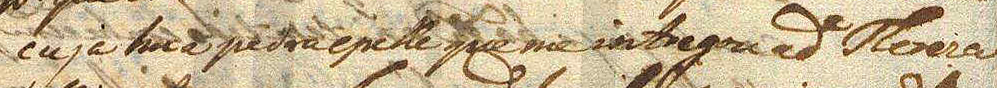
cuja hua pedra e pelle que me intregou a d.a Thereza
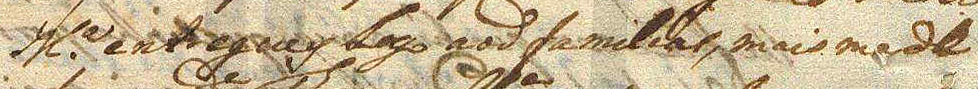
M.a entreguey Logo ao do familiar, mais ma de
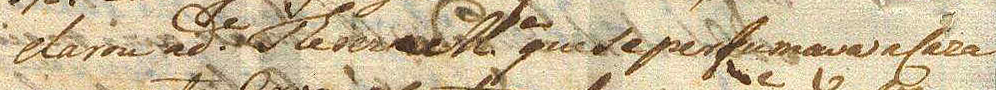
clarou a d̄.a Thereza M.a que se perfumava a Caza
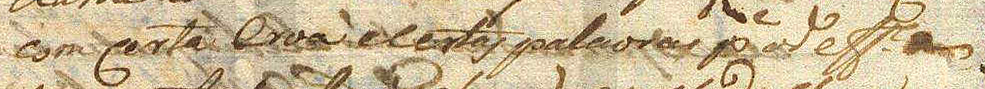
com Certa erva e certas palavras pa o do eff.to
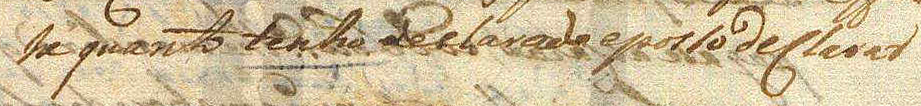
he quanto tenho declarado e posso deClarar
